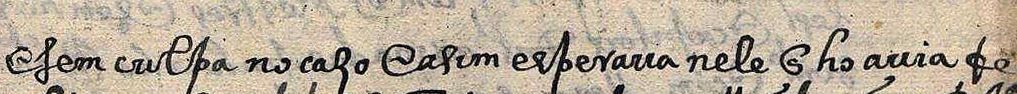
e sem culpa no cazo e asim esperaua nele q̄ ho auia De
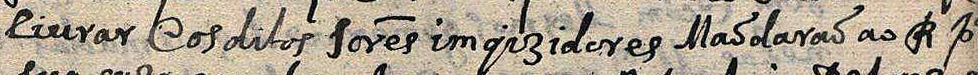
Liurar e os ditos sorēs imqizidores Maõdaraõ ao R pa
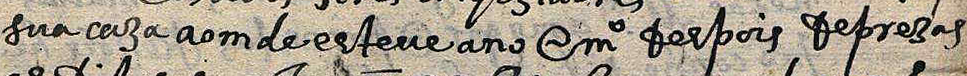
sua caza aomde esteue ano e mo Despois De prezas
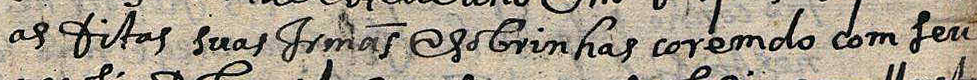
as Ditas suas Jrmās e sobrinhas coremdo com seu
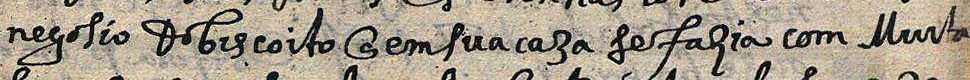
negosio Do biscoito q̄ em sua caza se fazia com Muita
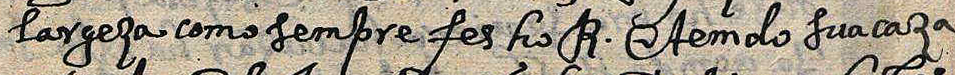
Largeza como sempre fes ho R. e temdo sua caza
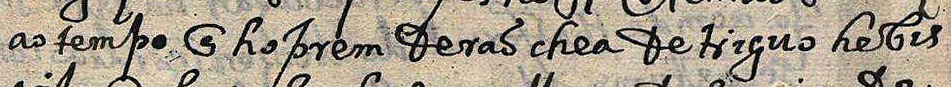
ao tempo q̄ ho premDeraõ chea De triguo he bis
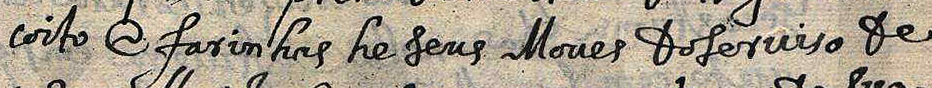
coito e farinhas he seus Moues Do seruiso De
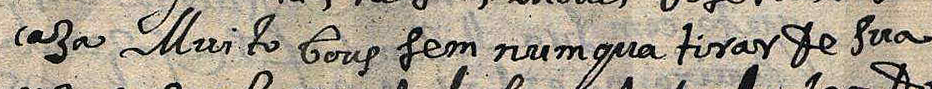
caza Muito bous sem numqua tirar De sua
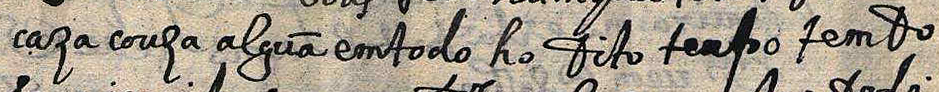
caza couza alguā em todo ho Dito tenpo temDo
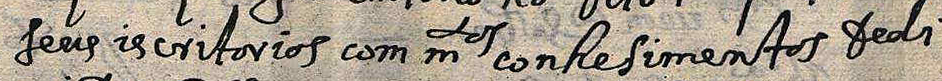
seus iscritorios com mtos conhesimentos De di
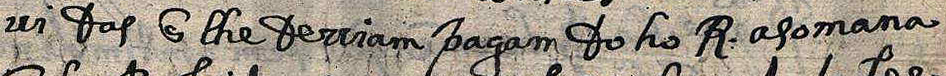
uiDas q̄ lhe Deuiam pagamDo ho R. a somana
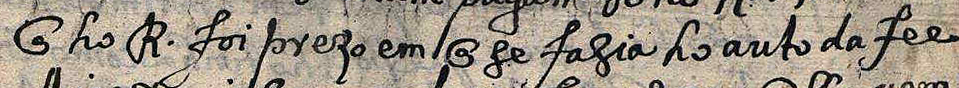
q̄ ho R. foi prezo em q̄ se fazia ho auto da fee
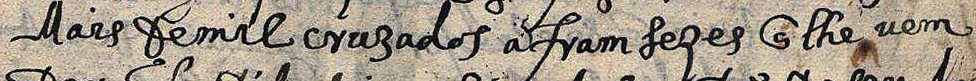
Mais De mil cruzados a framsezes q̄ lhe uem
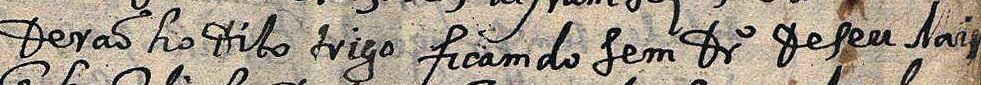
Deraõ ho Dito trigo ficamdo sem Dro De seu Mais
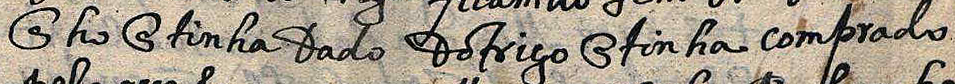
q̄ ho q̄ tinha Dado Do trigo q̄ tinha comprado
